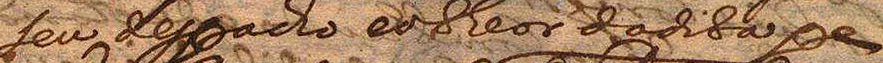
seu despacho e o theor da dita pe
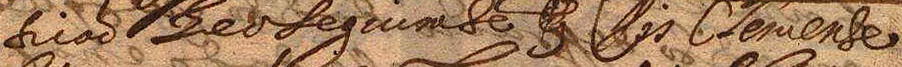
tiçaõ he o seguimte ⁋ Dis Clemente
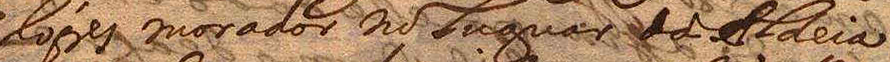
lopes morador no Luguar da Aldeia
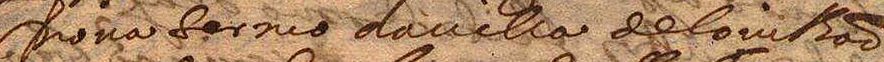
noua termo da uilla de Couilhaõ
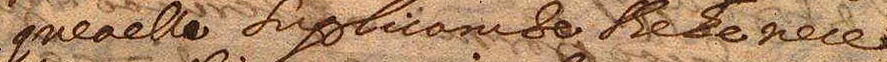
que a elle suplicamte lhe he nece
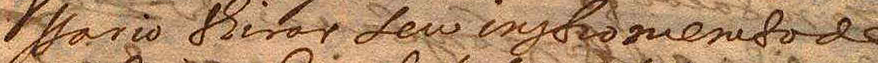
ssario thirar seu instromemto de
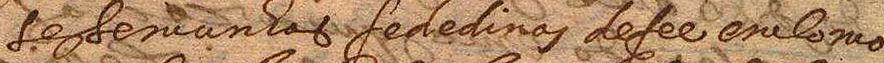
testemunhas fededinas de fee em como
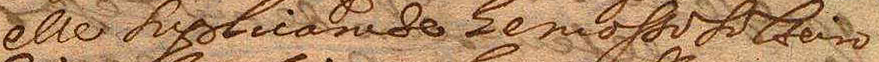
elle suplicamte he mosso solteiro
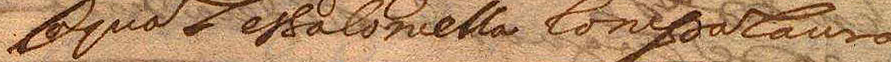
o quaL esta Com ella Com palaura
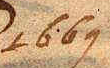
1669
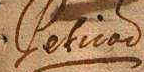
Peticaõ
